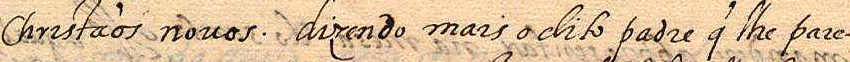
Christaõs nouos. dizendo mais o dito padre q̄ lhe pare
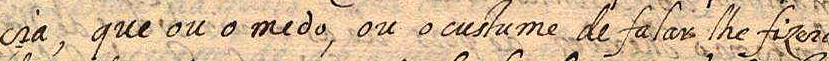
çia, que ou o medo, ou o custume de falar lhe fizera
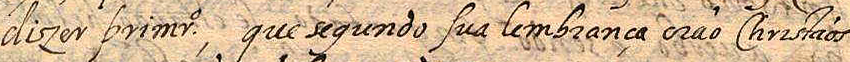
dizer primr.o, que segundo sua lembrança eraõ Christaõs
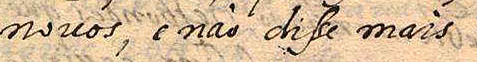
nouos, e naõ disse mais.
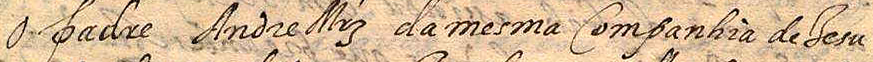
O padre Andre Mrz̄ da mesma Companhia de Iesu
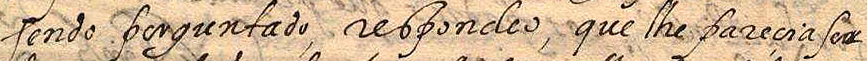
sendo perguntado, respondeo, que lhe pareçia ser
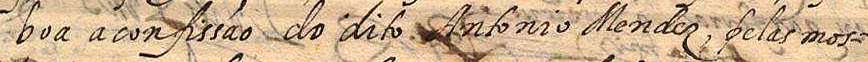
boa a confissão do dito Antonio Mendez, pelas mos
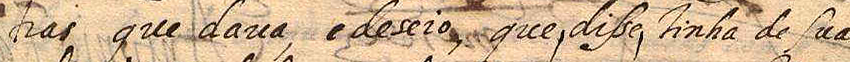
tras que daua, e deseio, que, disse, tinha de sua
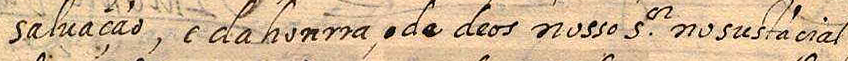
saluação, e da honrra, e de deos nosso s.or no sustācial
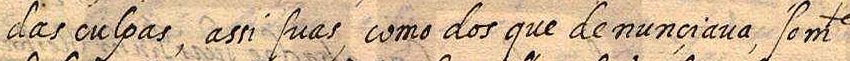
das culpas, assi suas, como dos que denunçiaua, somte
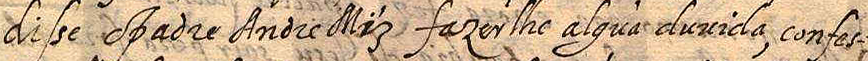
disse o padre Andre Miz̄ fazerlhe alguā duuida, confes
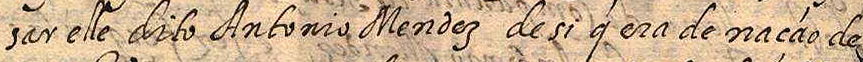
sar elle dito Antonio Mendez de si q̄ era de nação de
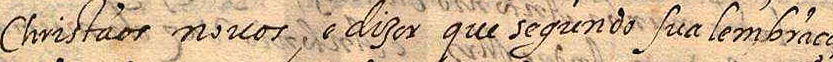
Christãos nouos, e dizer que segundo sua lembrāça,
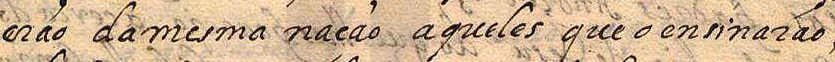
erão da mesma nação aqueles que o ensinarão,
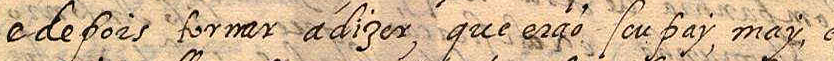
e depois tornar a dizer, que eraõ seu pay, may, e
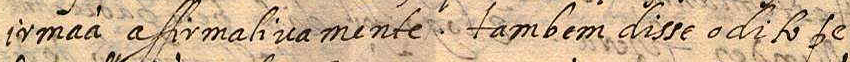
irmaā affirmatiuamente. tambem disse o dito pe
